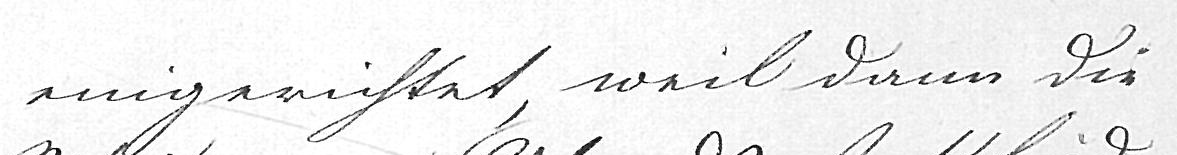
eingerichtet, weil dann die
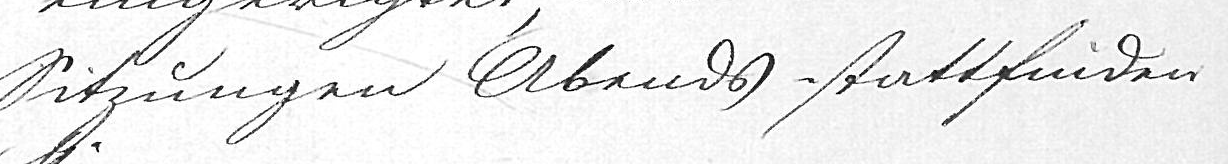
Sitzungen Abends stattfinden
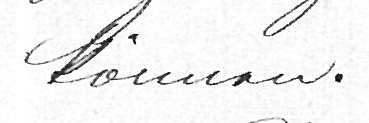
können.
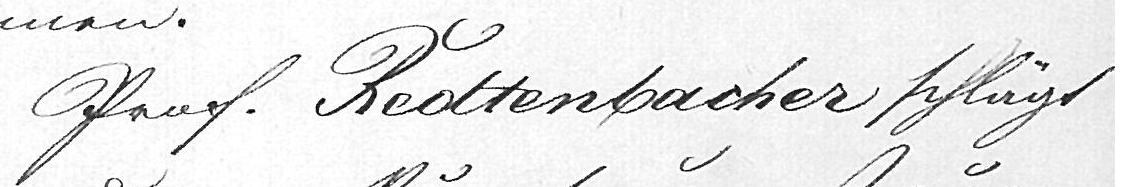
Prof. Redtenbacher schlägt
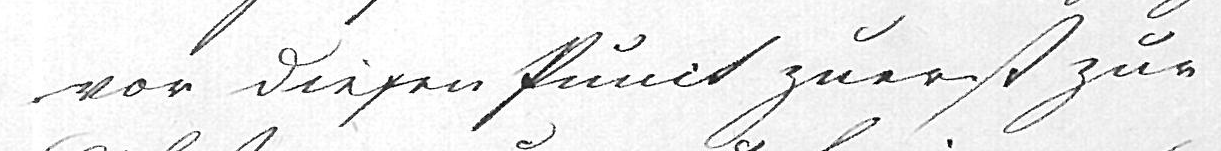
vor diesen Puncte zuerst zur
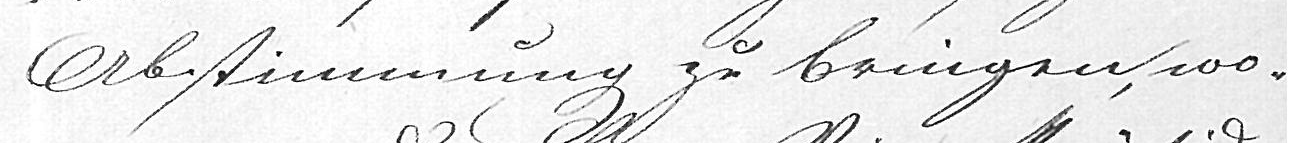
Abstimmung zu bringen, wo-
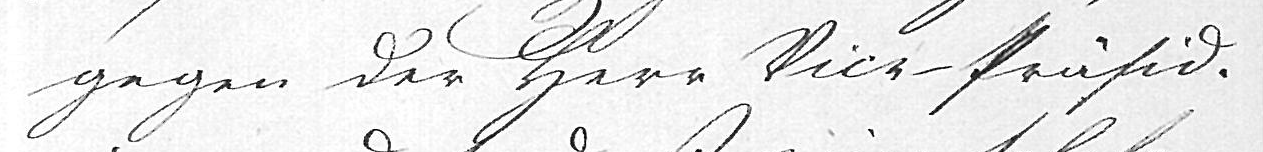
gegen der Herr Vice-Präsid.
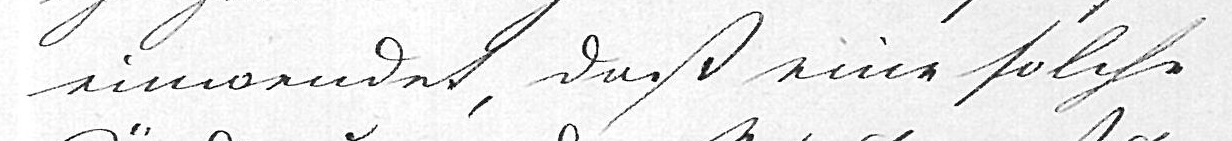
einwendet, daß eine solche
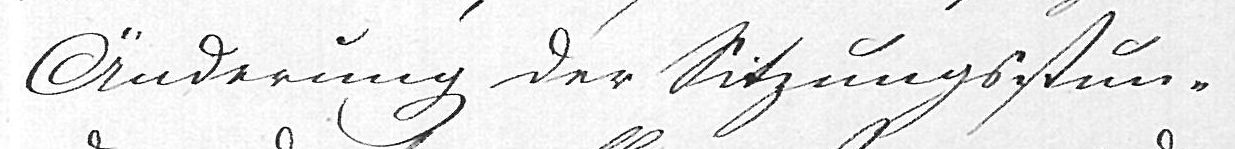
Änderung der Sitzungsstun-
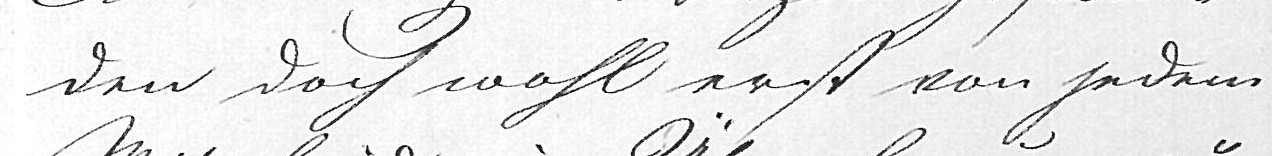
den doch wohl erst von jedem
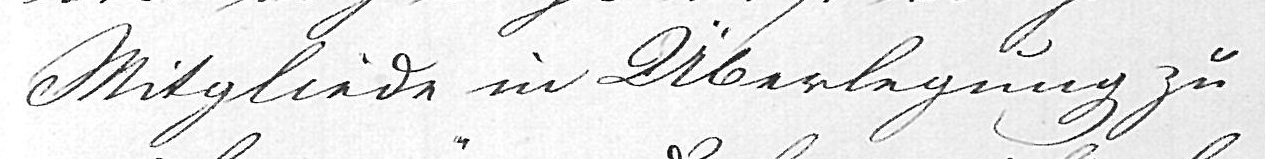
Mitgliede im Überlegung zu
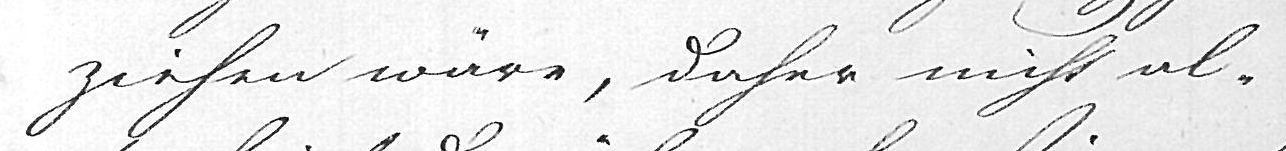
ziehen wäre, daher nicht al-
